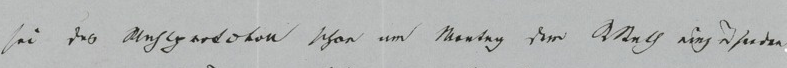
sei das Wahlprotokoll schon am Montag dem RRath einzusenden.
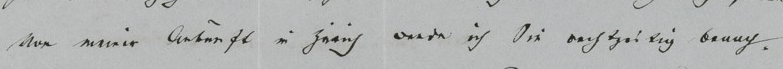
Von meiner Ankunft in Zürich werde ich Sie rechtzeitig benach-
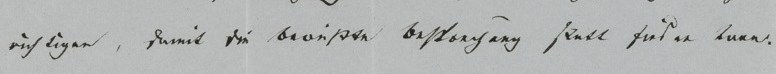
richtigen, damit die bewußte Besprechung statt finden kann.
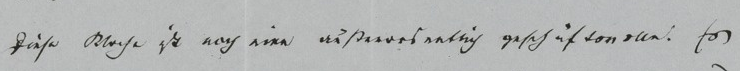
Diese Woche ist noch eine außerordentlich geschäftsvolle. Es
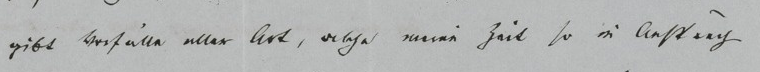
gibt Vorfälle aller Art, welche meine Zeit so in Anspruch
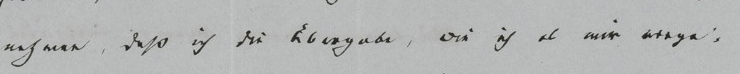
nehmen, daß ich die Übergabe, wie ich es mir vorge-
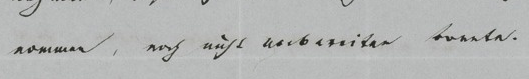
nommen, noch nicht vorbereiten konnte.
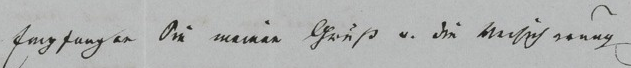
Empfangen Sie meinen Gruß &. die Versicherung
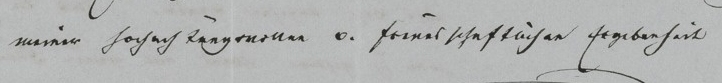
meiner hochachtungsvollen &. freundschaftlichen Ergebenheit
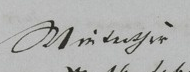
Winterthur
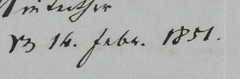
den 14. Febr. 1851.
